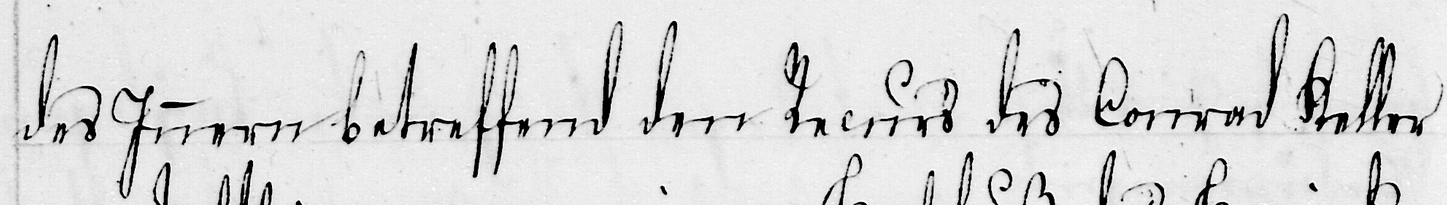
des Innern betreffend den Recurs des Conrad Keller
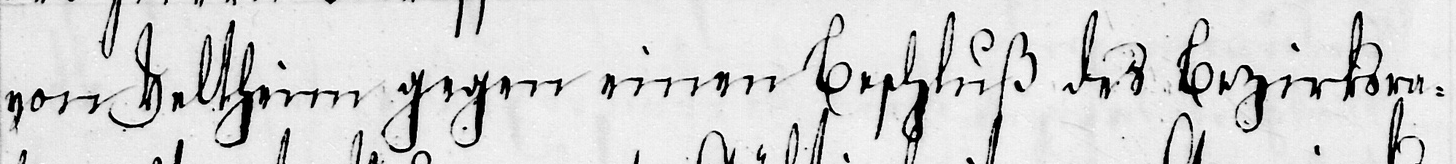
von Veltheim gegen einen Beschluß des Bezirksra¬
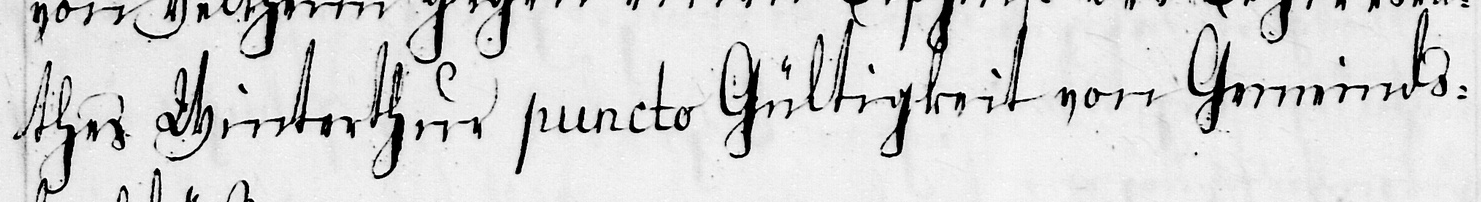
thes Winterthur puncto Gültigkeit von Gemeinds¬
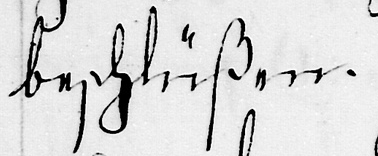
beschlüßen.
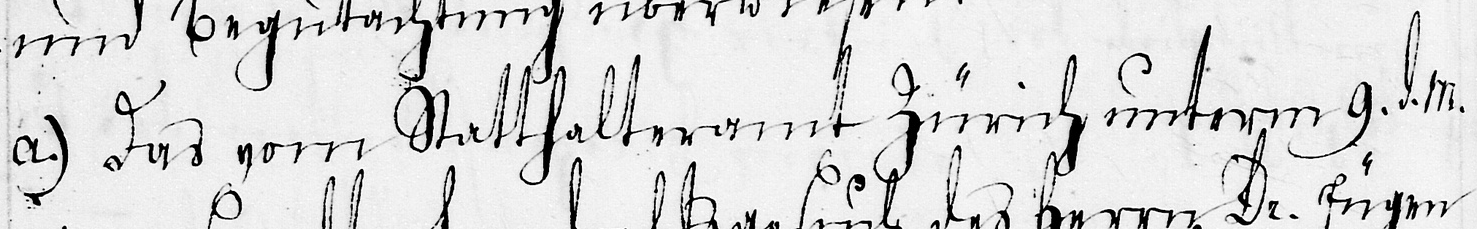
a.) Das vom Statthalteramt Zürich unterm 9. d. M.
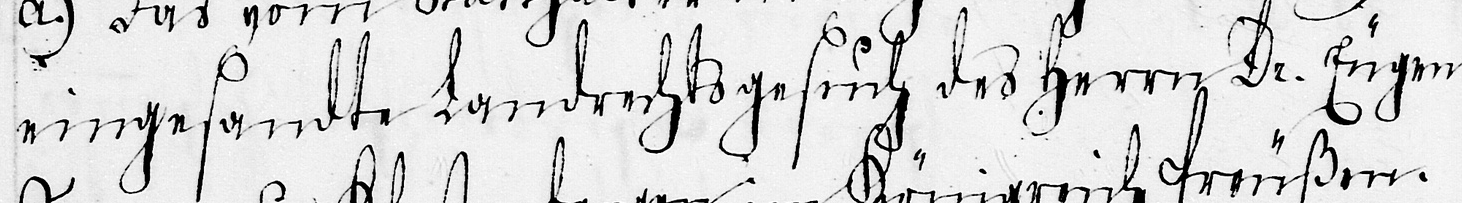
eingesandte Landrechtsgesuch des Herrn Dr. Eugen
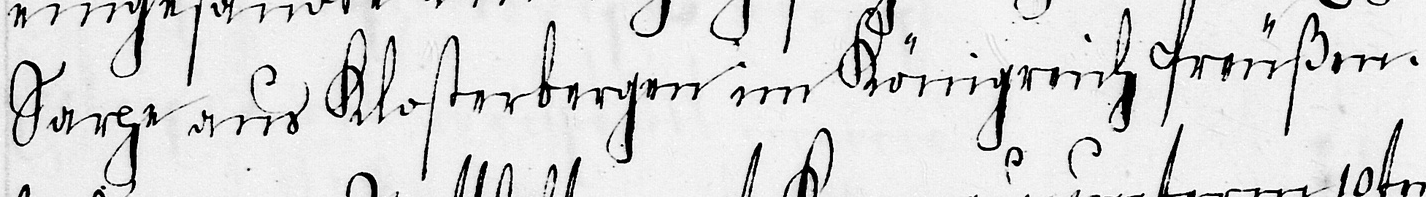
Sarge aus Klosterbergen im Königreich Preußen.
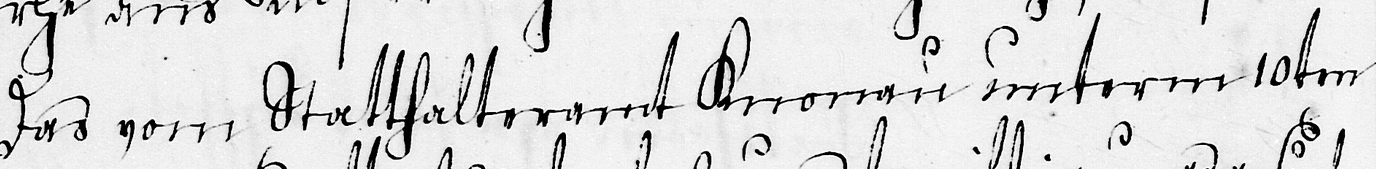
Das vom Statthalteramt Knonau unterm 10ten
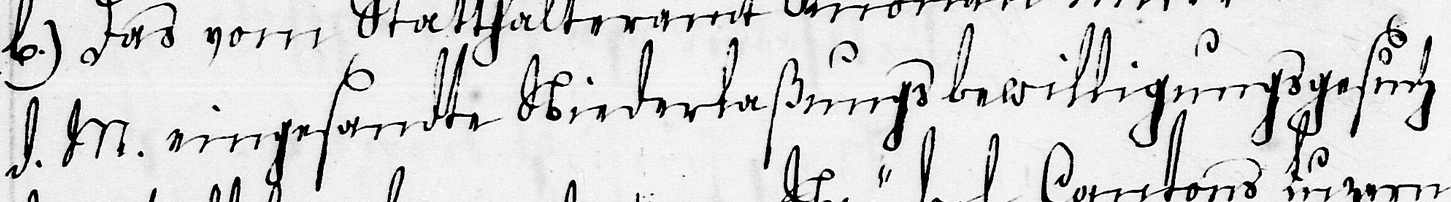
d. M. eingesandte Niederlaßungsbewilligungsgesuch
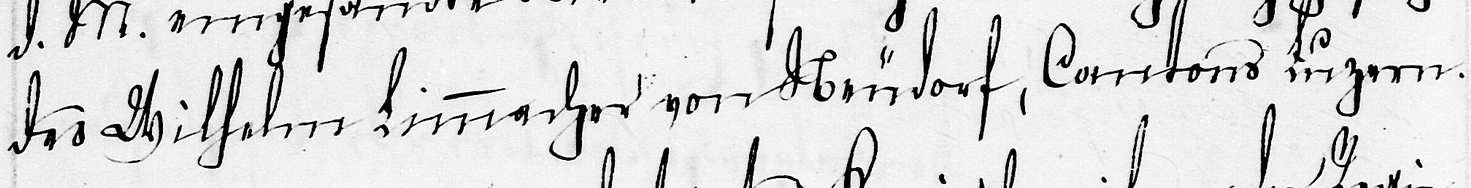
des Wilhelm Limmacher von Neudorf, Cantons Luzern.
